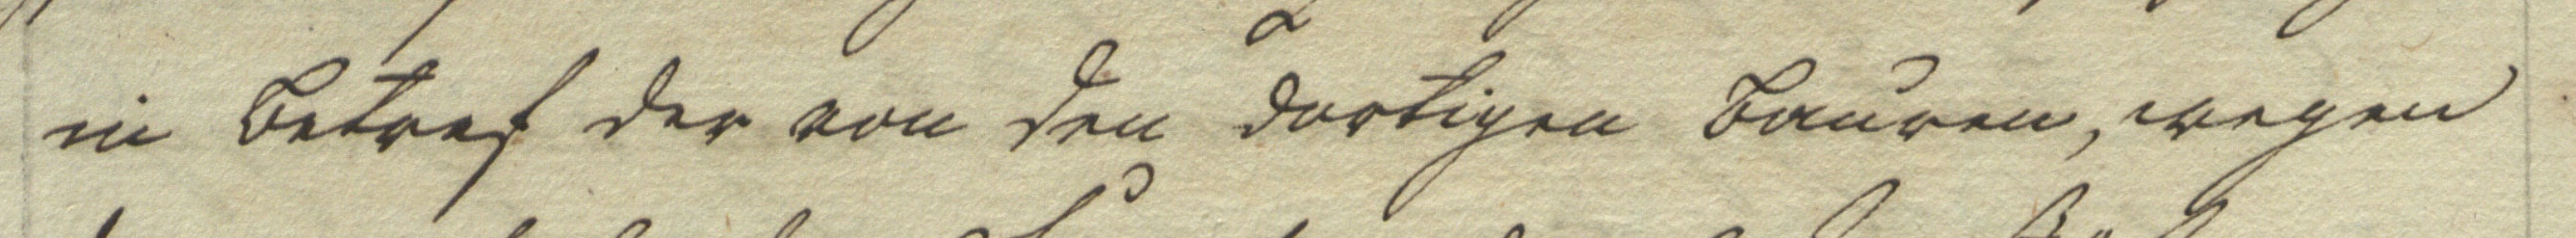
in Betref der von den dortigen Bauren, wegen
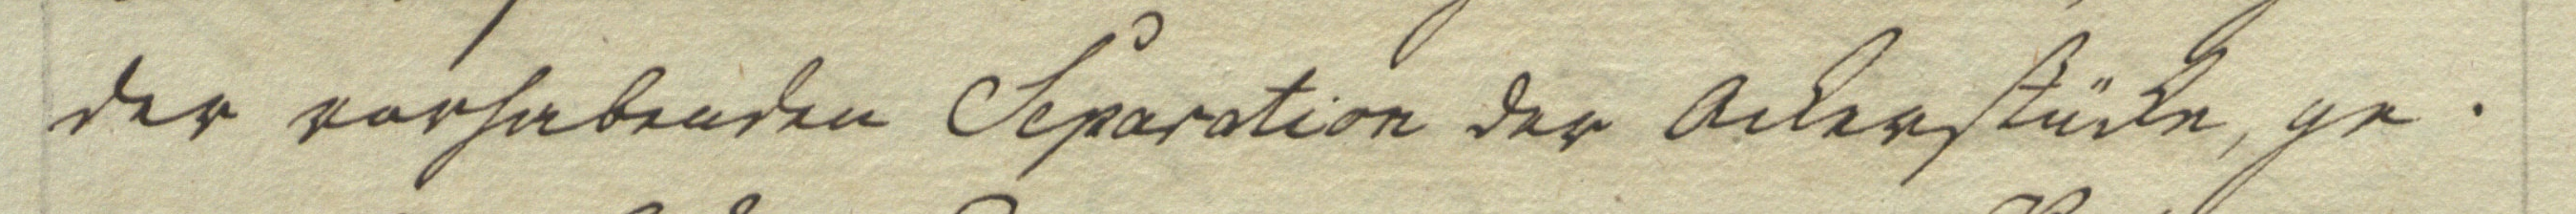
der vorhabenden Separation der Ackerstücke, ge¬
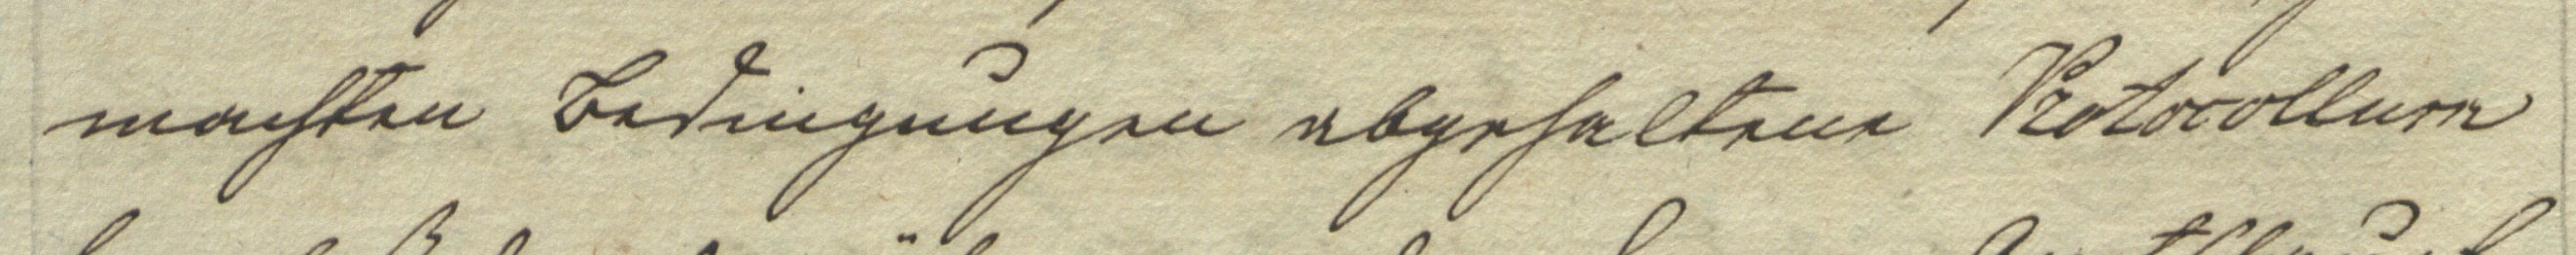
machten Bedingungen abgehaltene Protocollum
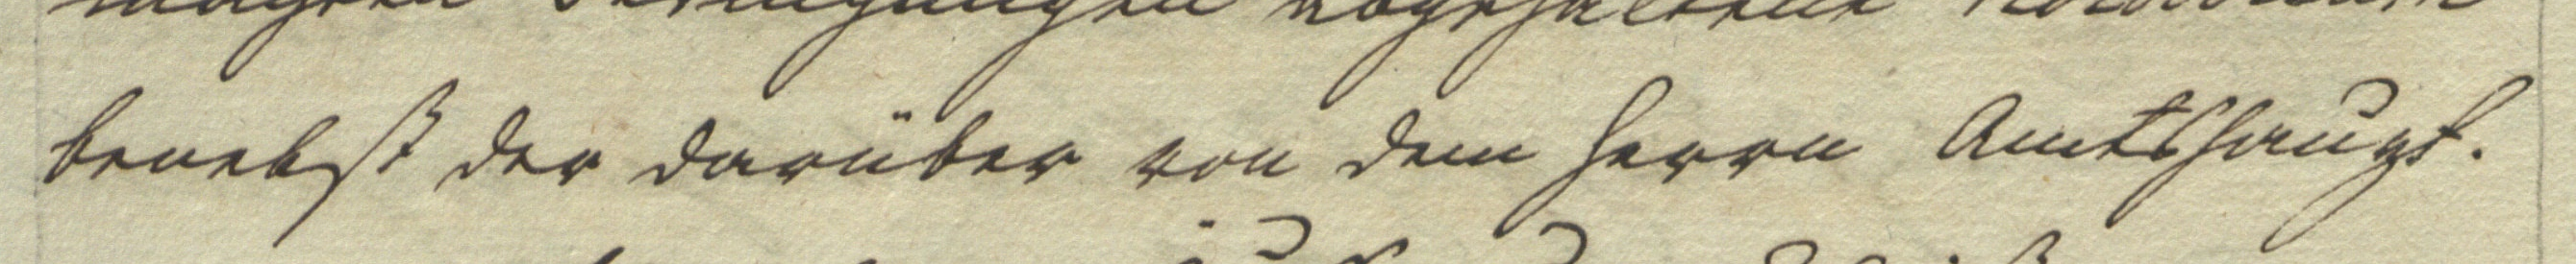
benebst der darüber von dem Herrn Amtshaupt¬
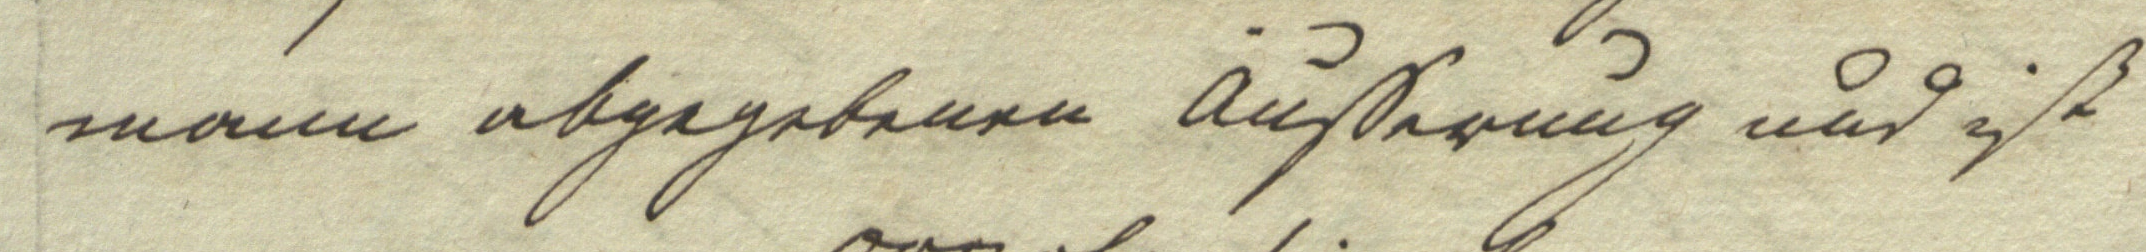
mann abgegebenen Äusserung und ist
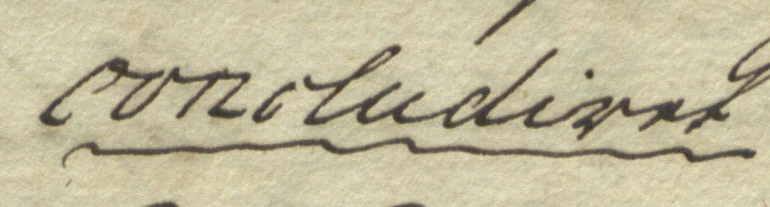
concludiret
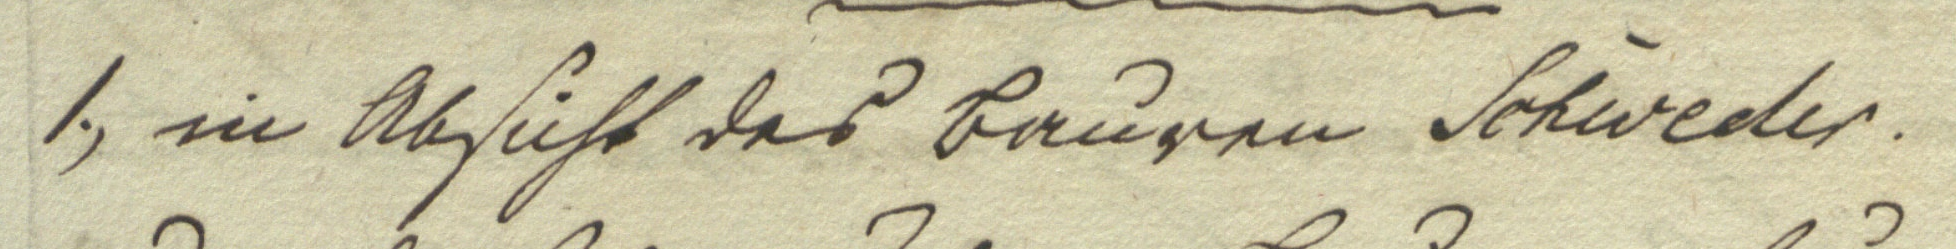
1., in Absicht des Bauren Schweder.
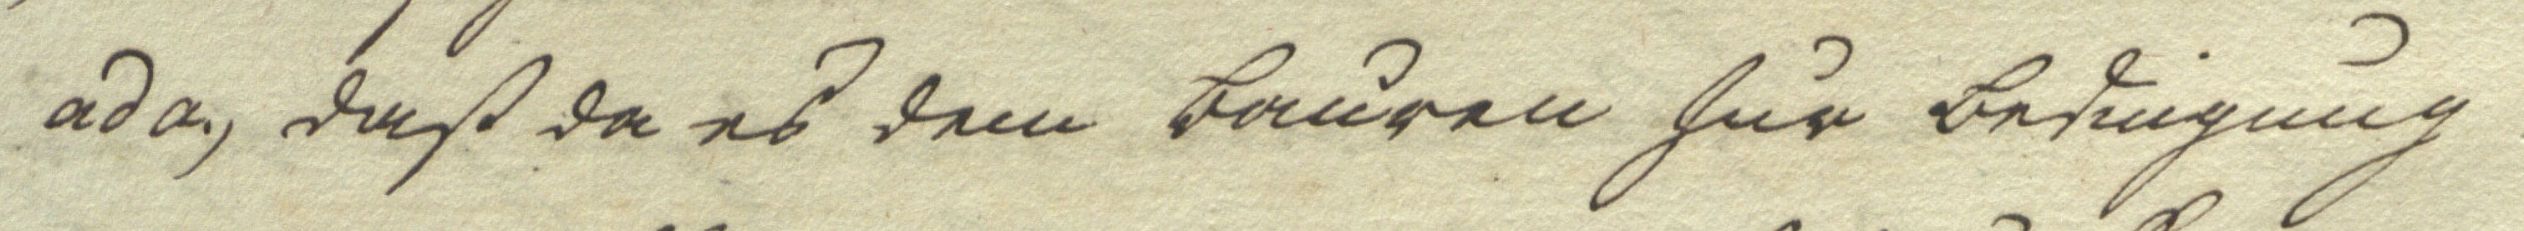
ad a., daß da es dem Bauren zur Bedingung
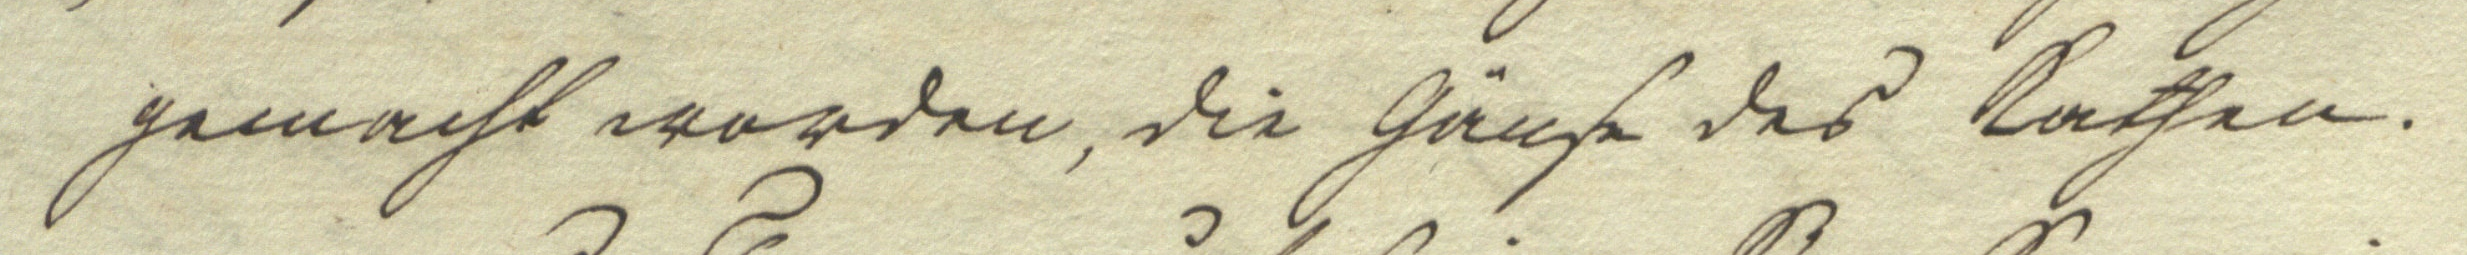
gemacht worden, die Gänse des Kathen¬
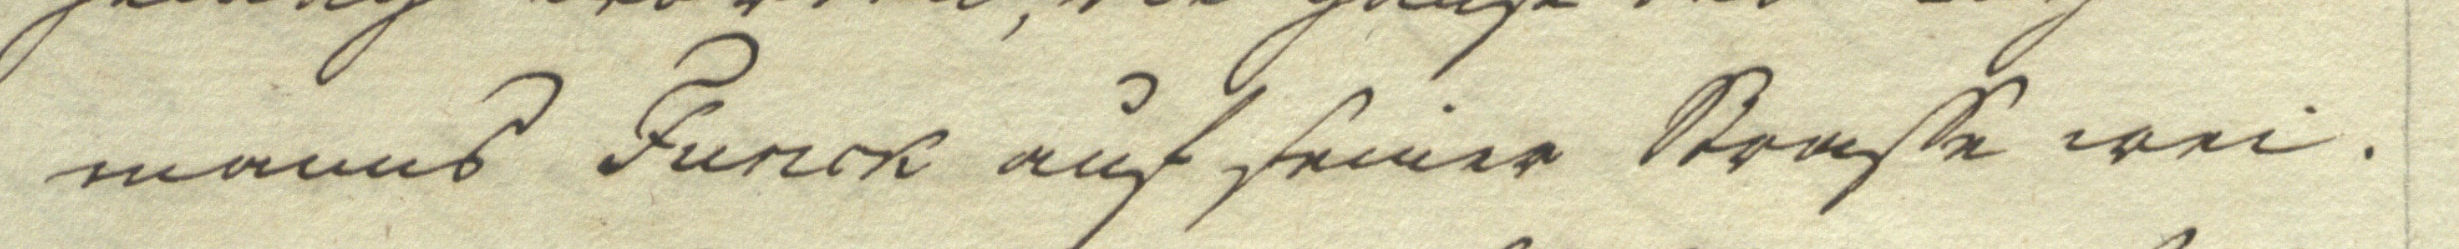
manns Funck auf seiner Strasse wei¬
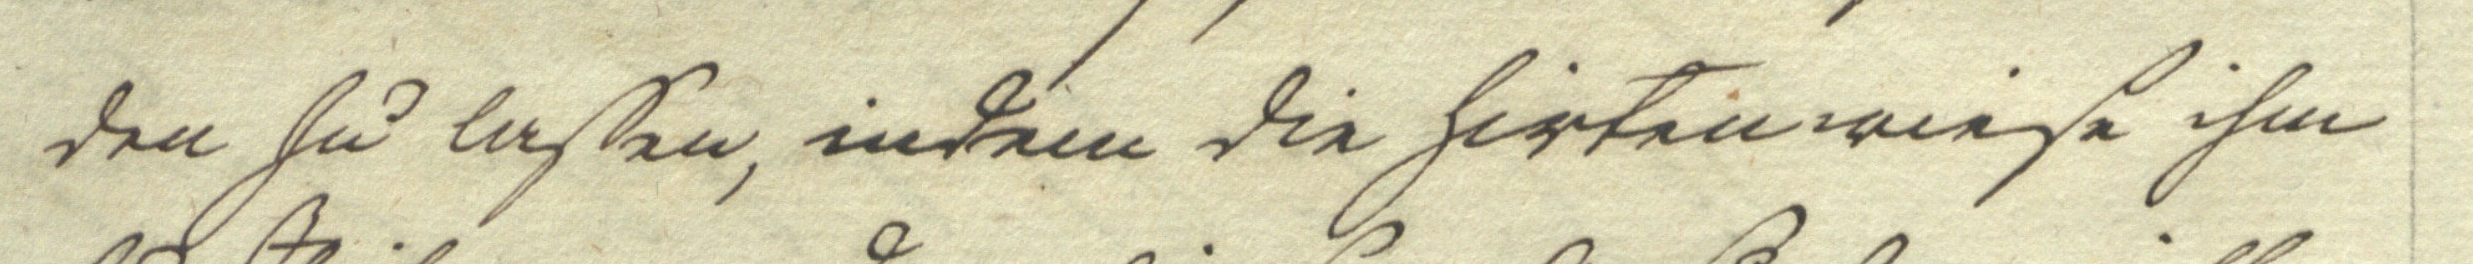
den zu lassen, indem die Hirtenwiese ihm
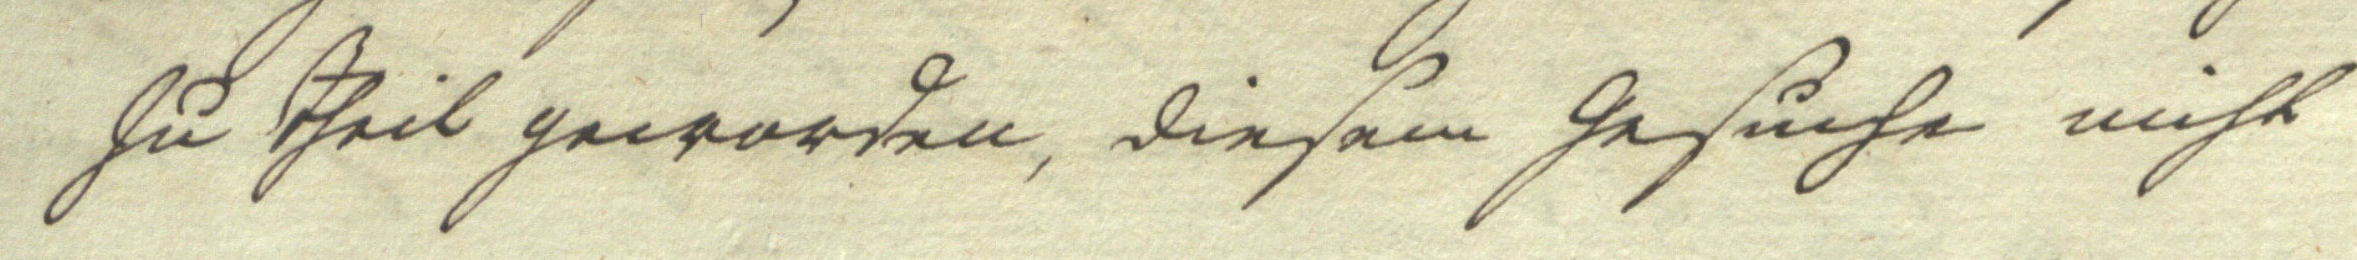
zu Theil geworden, diesem Gesuche nicht
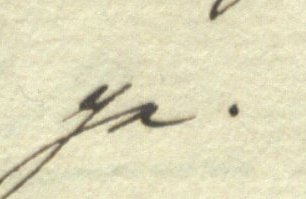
ge¬
